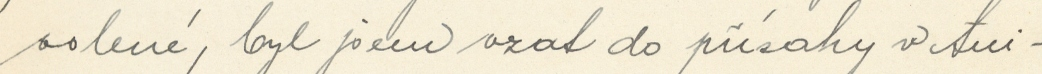volené, byl jsem vzat do přísahy v Ani-
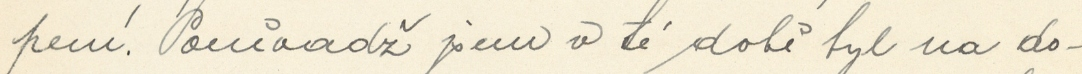pení. Poněvadž jsem v té době byl na do-
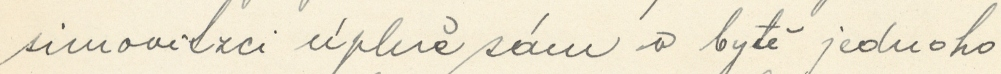simovitzci úplně sám v bytě jednoho
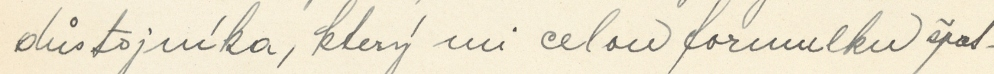důstojníka, který mi celou formulku špat-
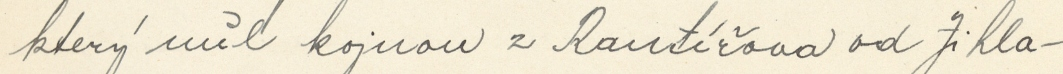který měl kojnou z Rantířova od Jihla-
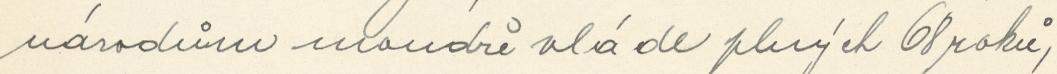národům moudře vládl plných 68 roků,
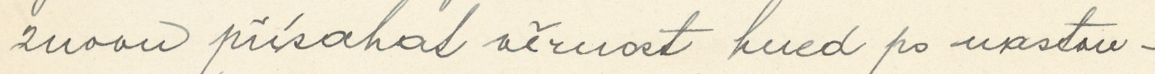znovu přísahat věrnost hned po nastou-
